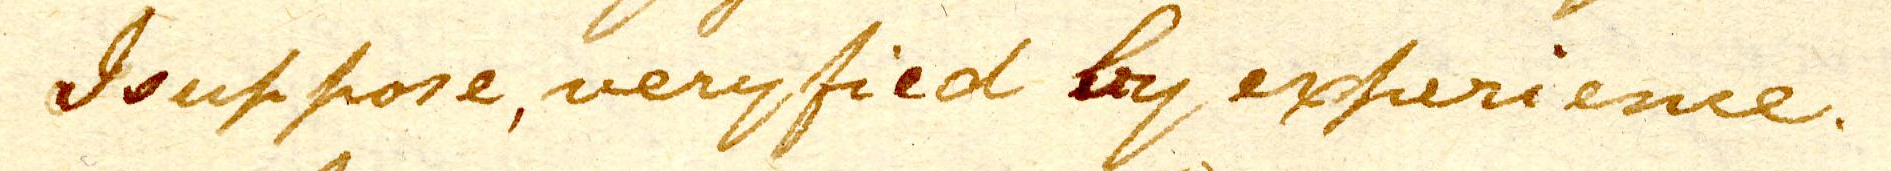I suppose, veryfied by experience.
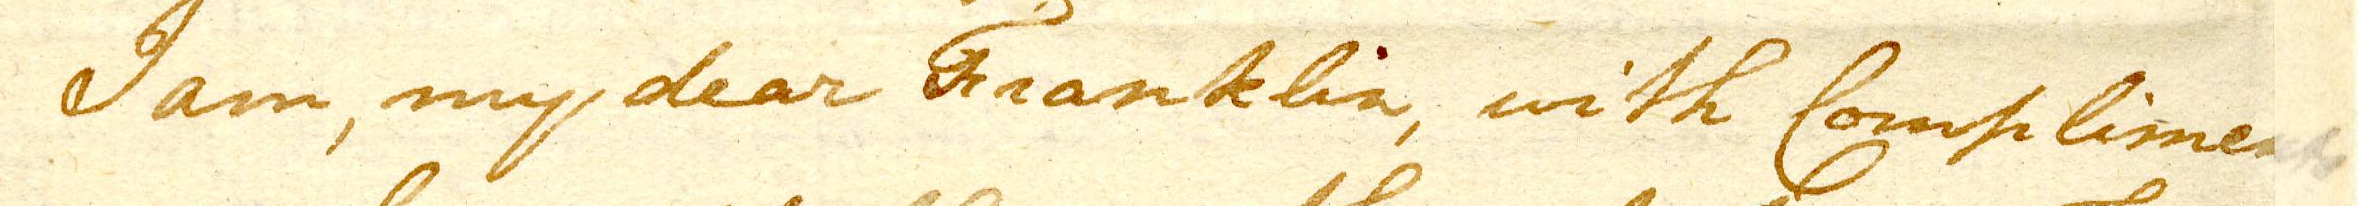I am, my dear Franklin, with Compliments
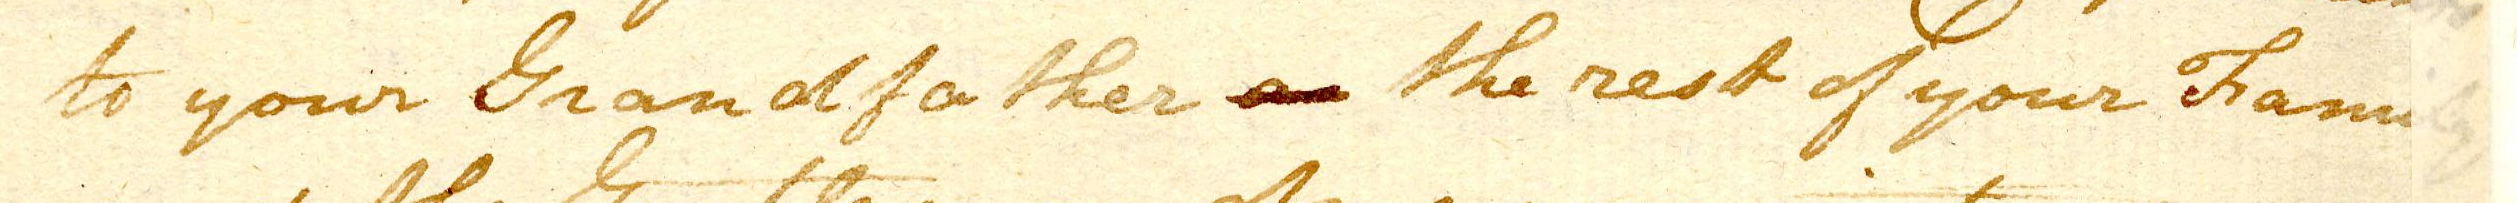to your Grandfather- the rest of your Family
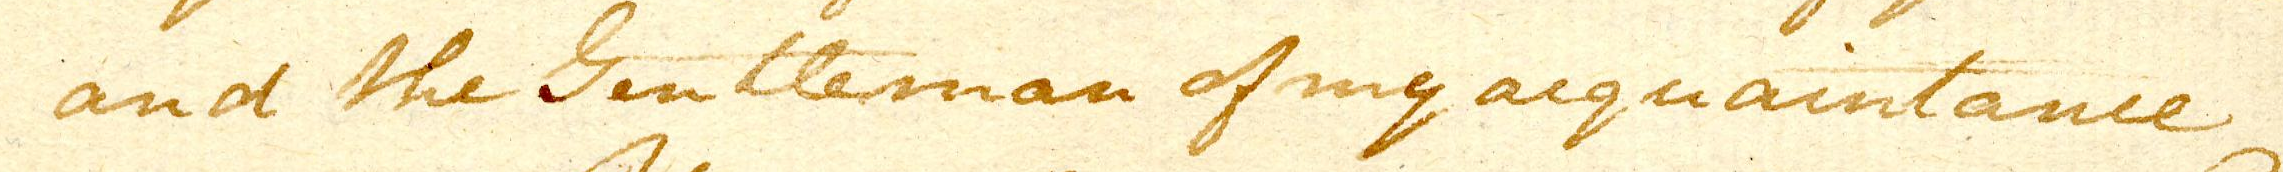and the Gentleman of my acquaintance
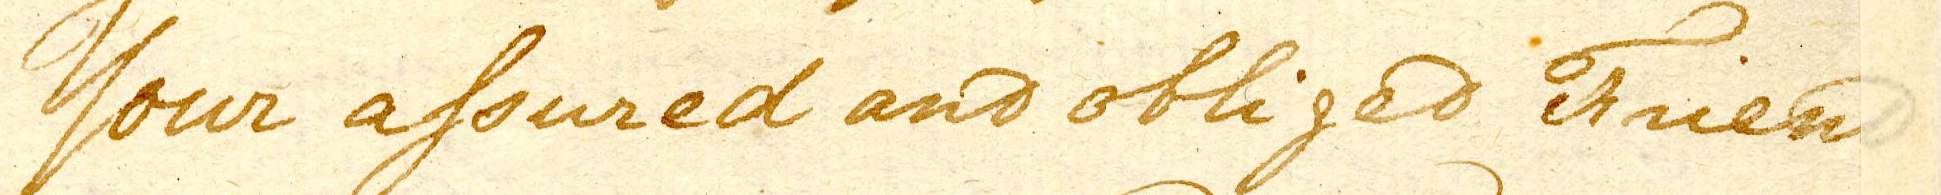Your assured and obliged Friend
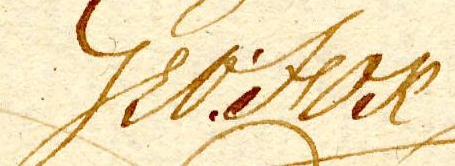Geo: Fox
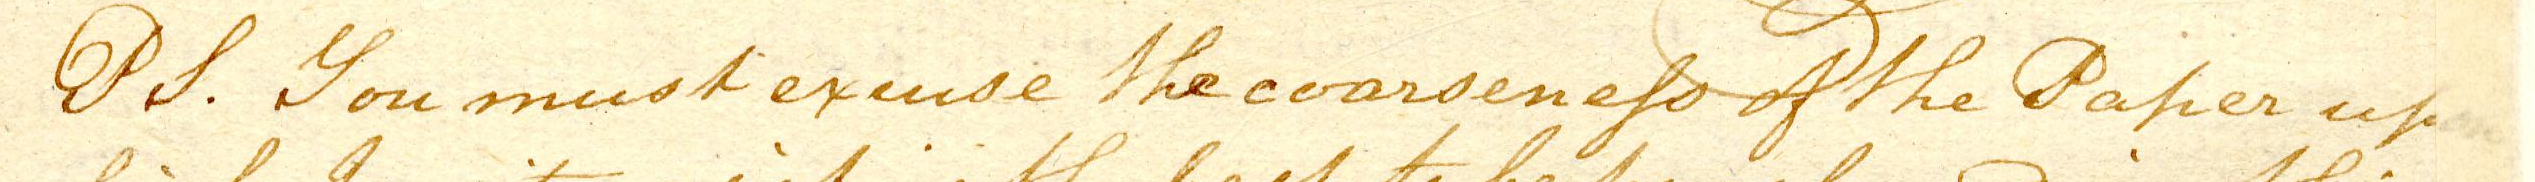PS. You must excuse the coarseness of the Paper upon
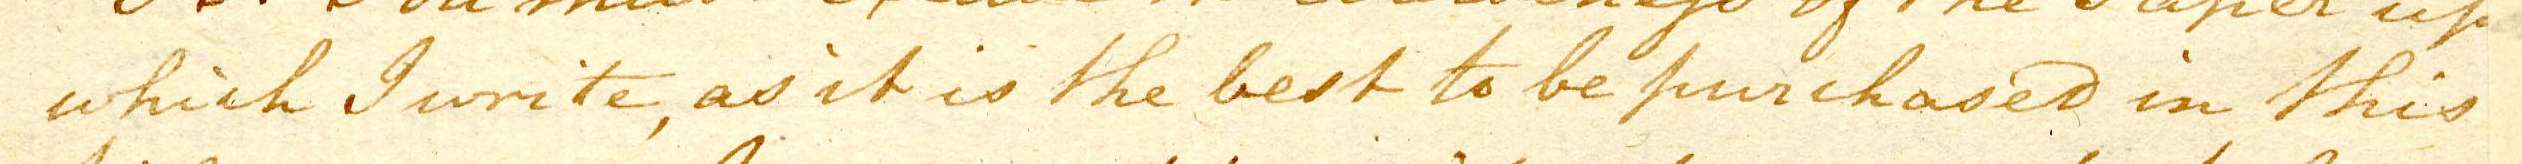which I write, as it is the best to be purchased in this
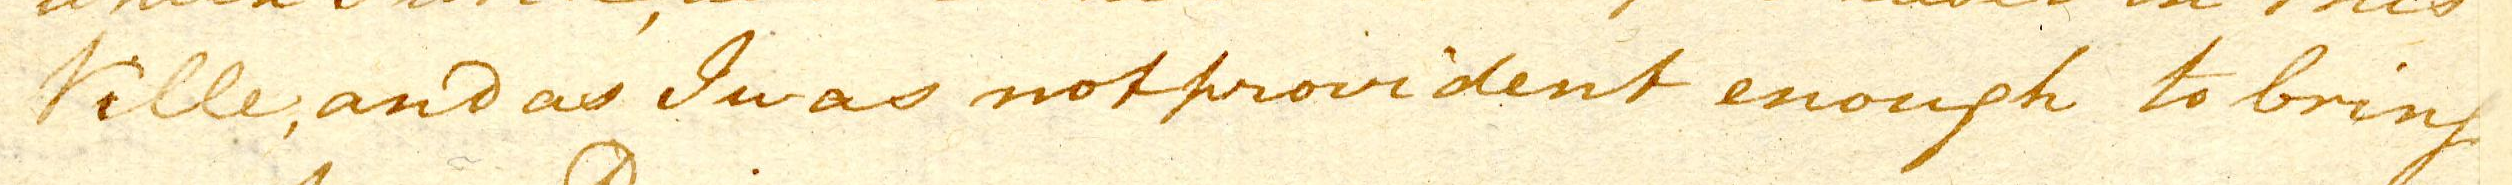Ville, and as I was not provident enough to bring
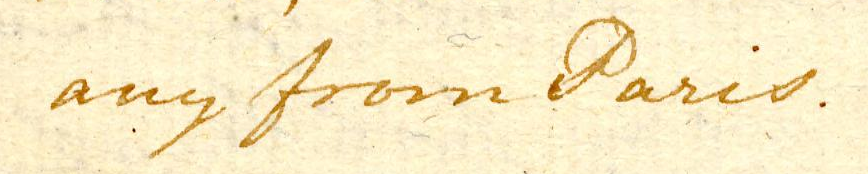any from Paris.
